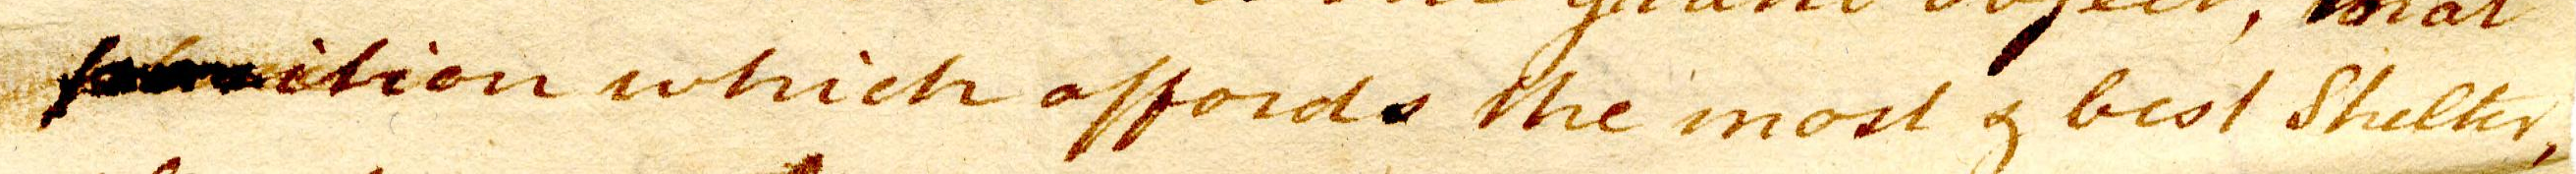[____]ition which affords the most & best Shelter,
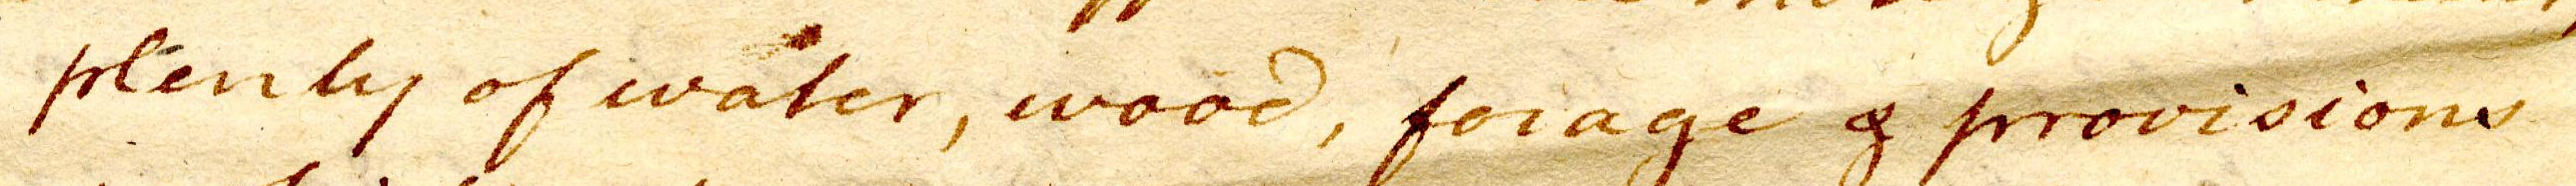plenty of water, wood, forage & provisions
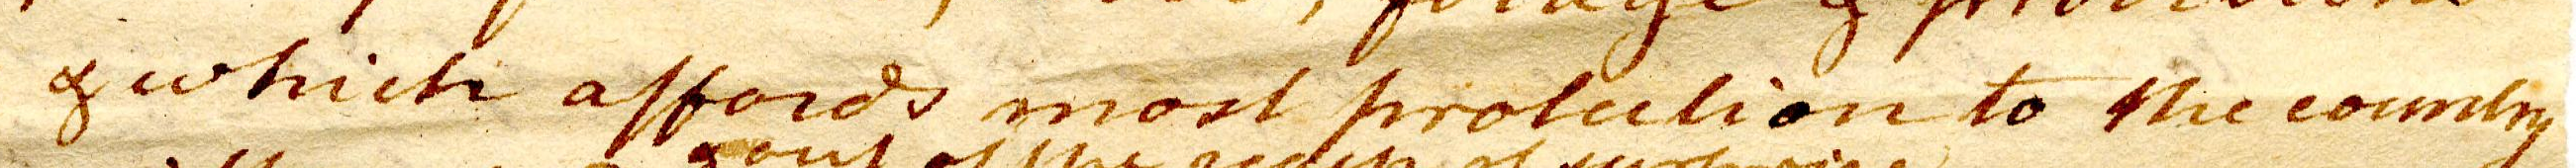& which affords most protection to the country
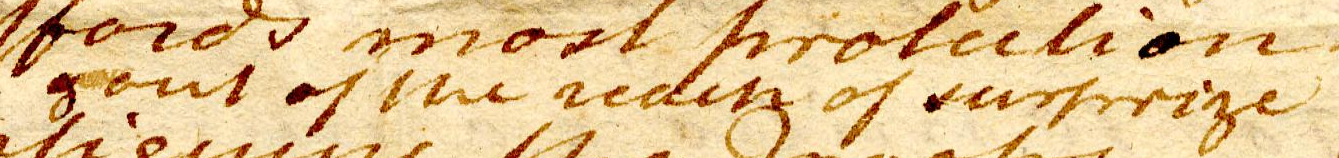& out of the reach of surprize
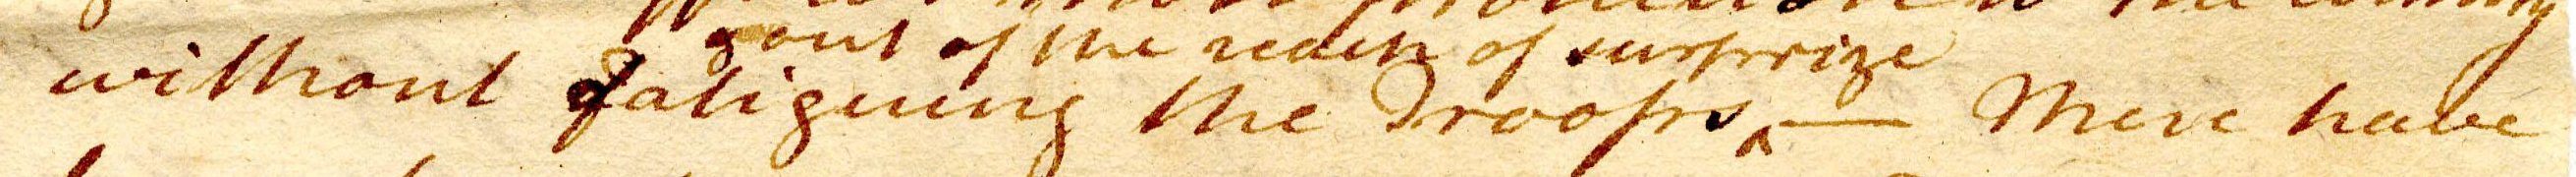without fatiguing the Troops ^ - there have
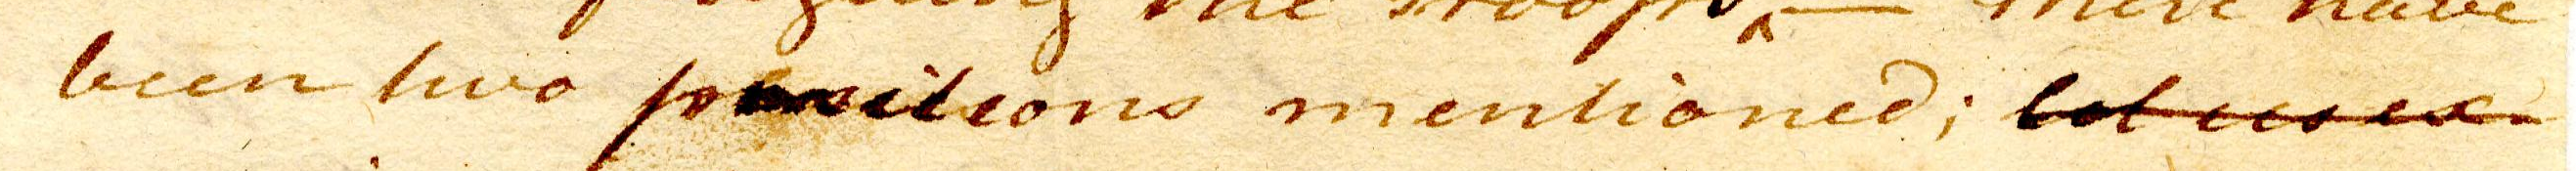been two positions mentioned; [let us ex-
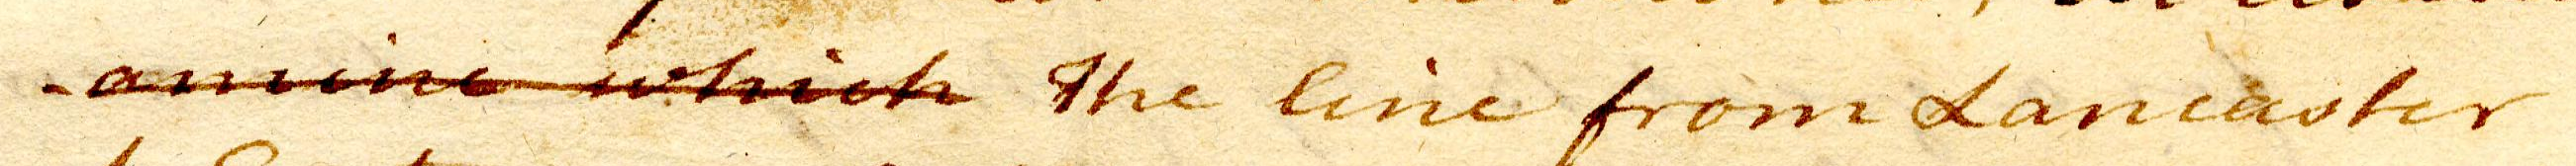amine which] the line from Lancaster
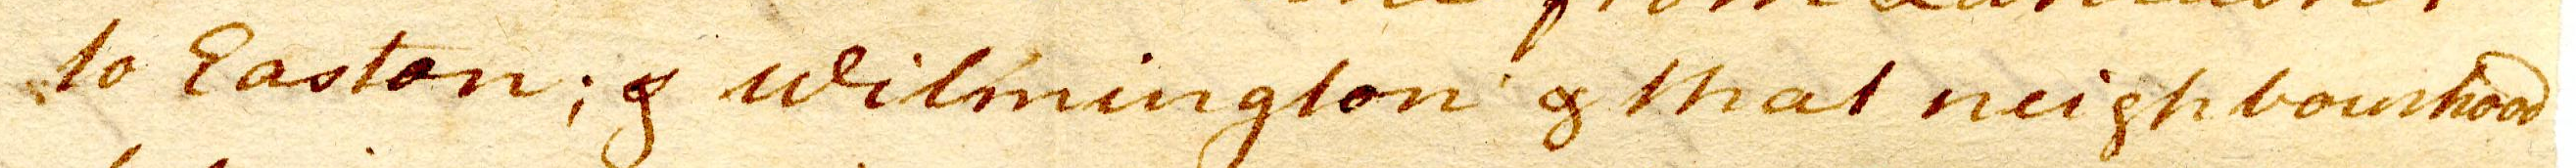to Easton; & Wilmington & that neighbourhood
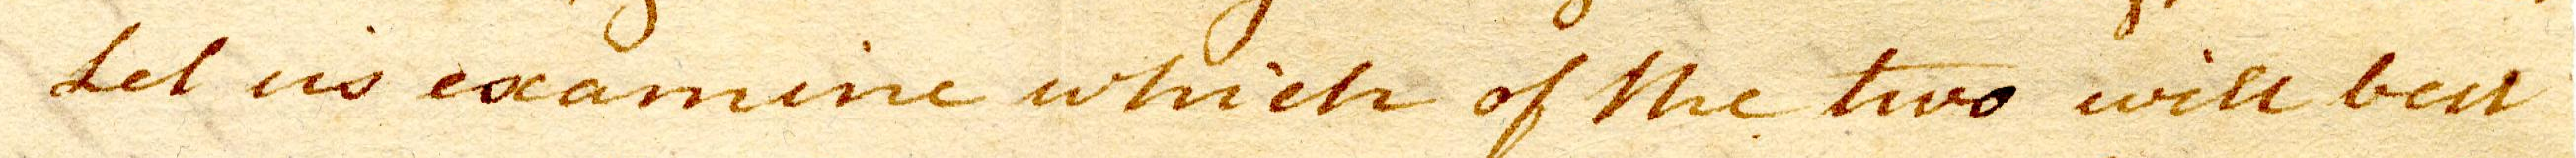Let us examine which of the two will best
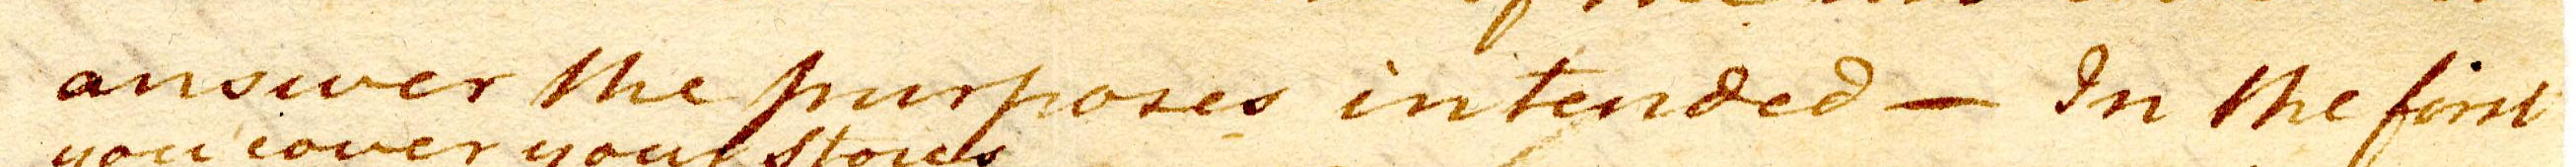answer the purposes intended- In the first
